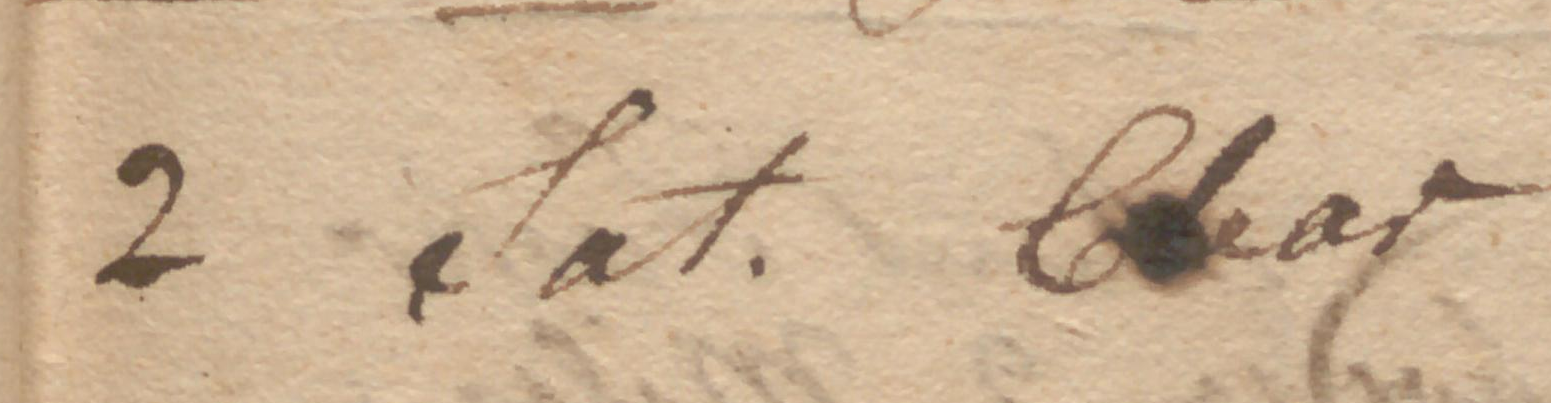2 Sat. Clear
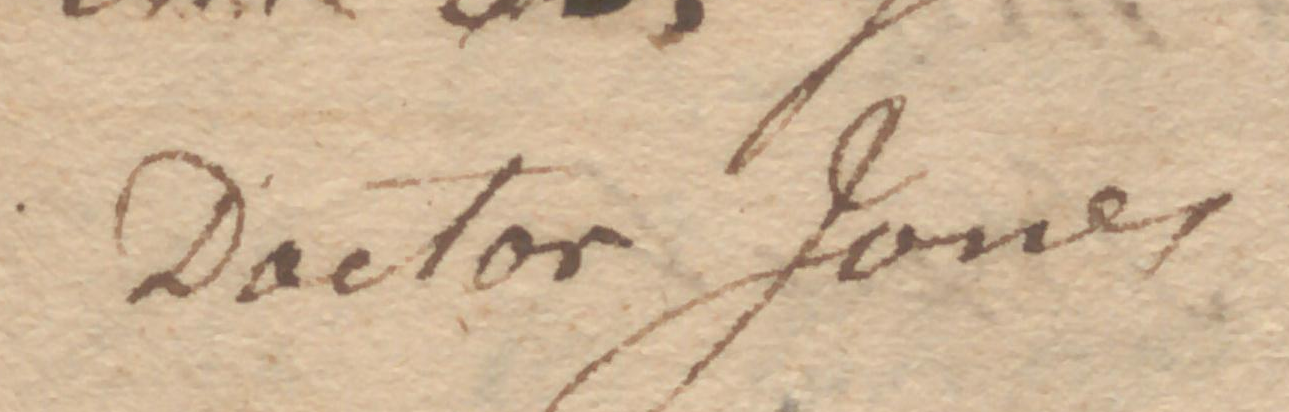Doctor Jones
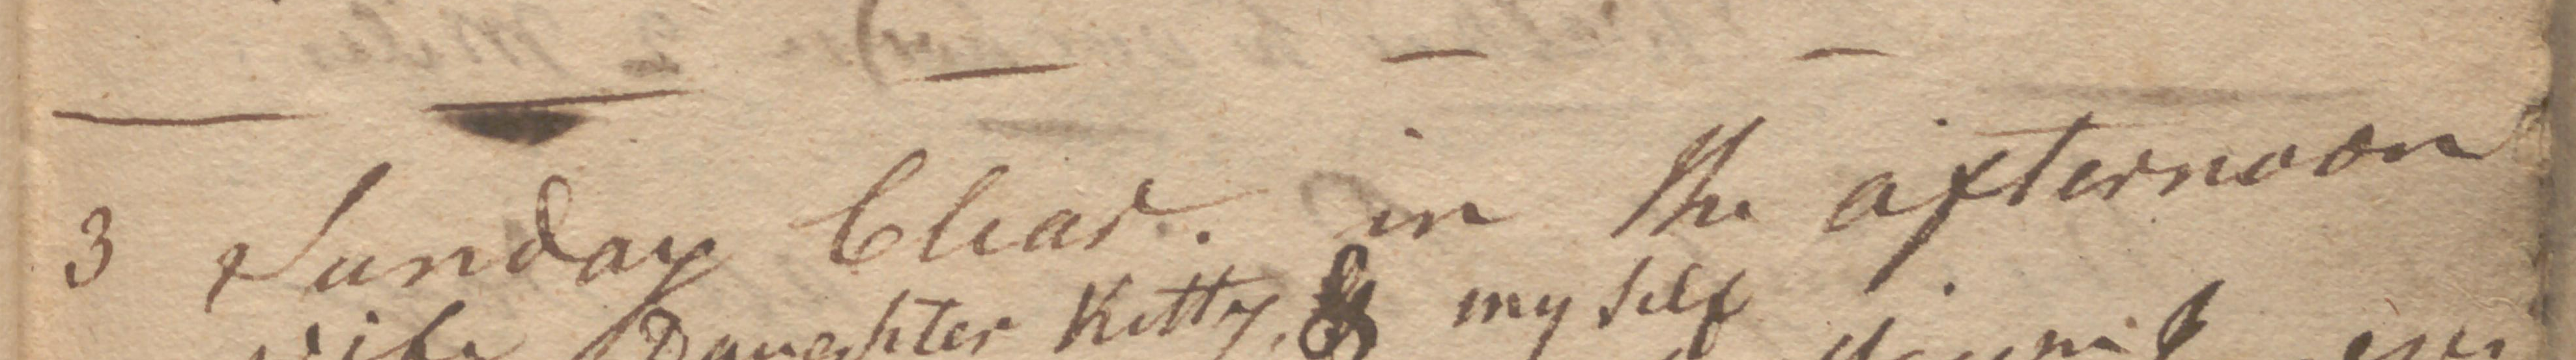3 Sunday Clear. in the afternoon
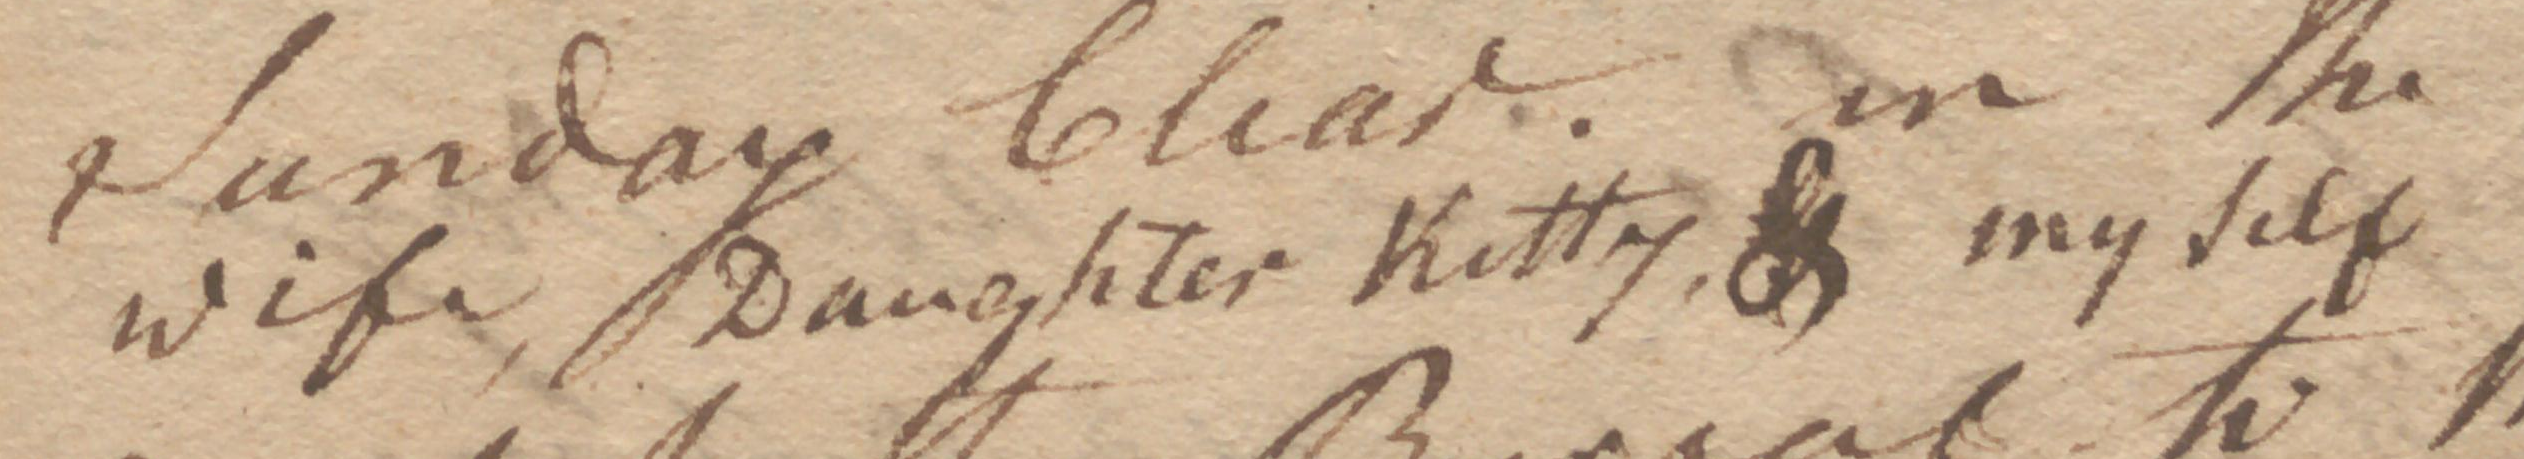wife, Daughter Kitty & my self
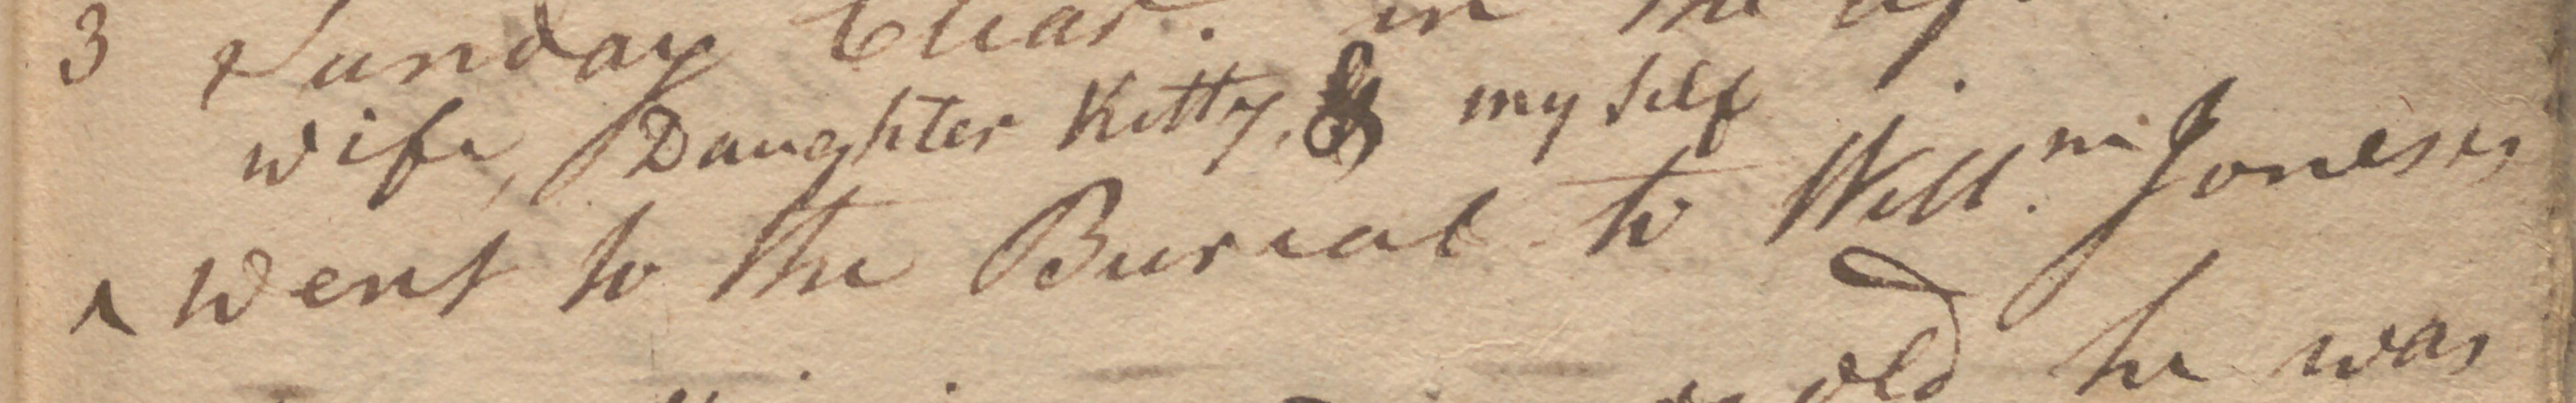a went to the Burial to Will^m. Joneses
